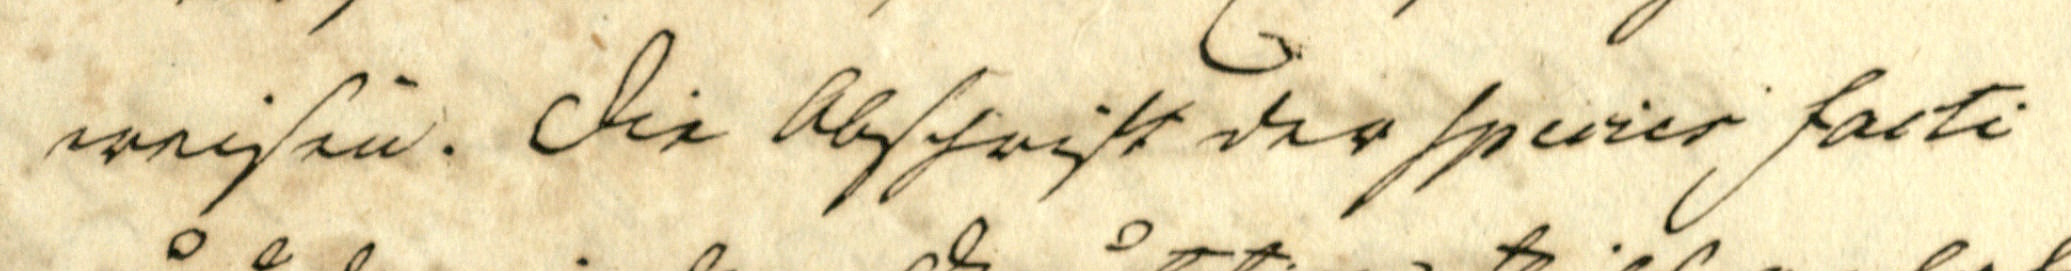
weisen. Die Abschrift der species facti
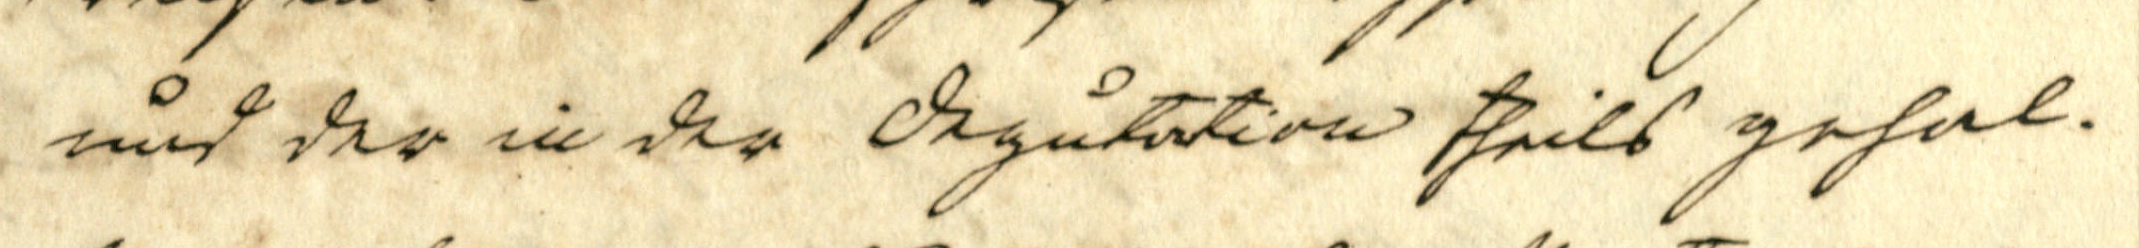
und der in der Deputation theils gehal-
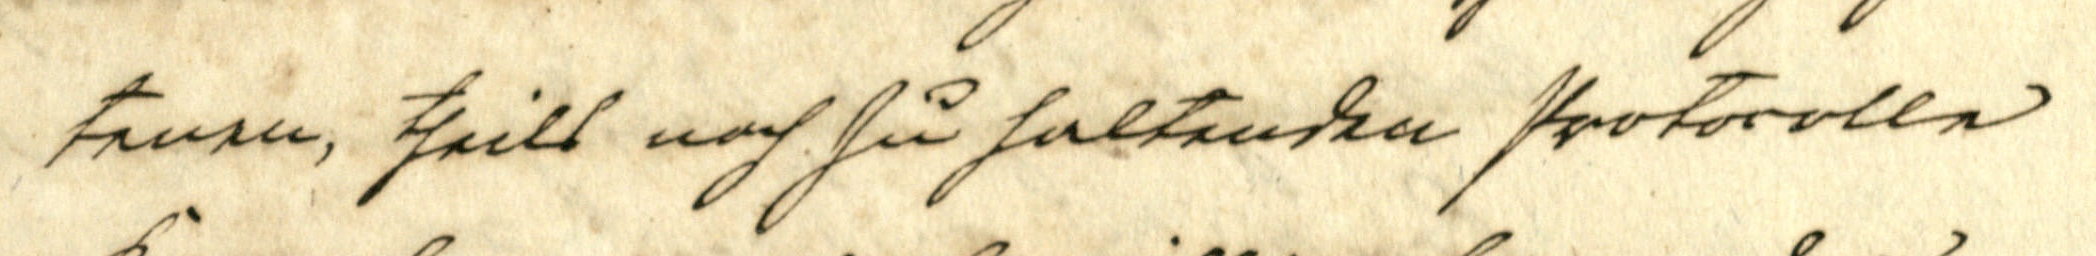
tenen, theils noch zu haltenden Protocolle
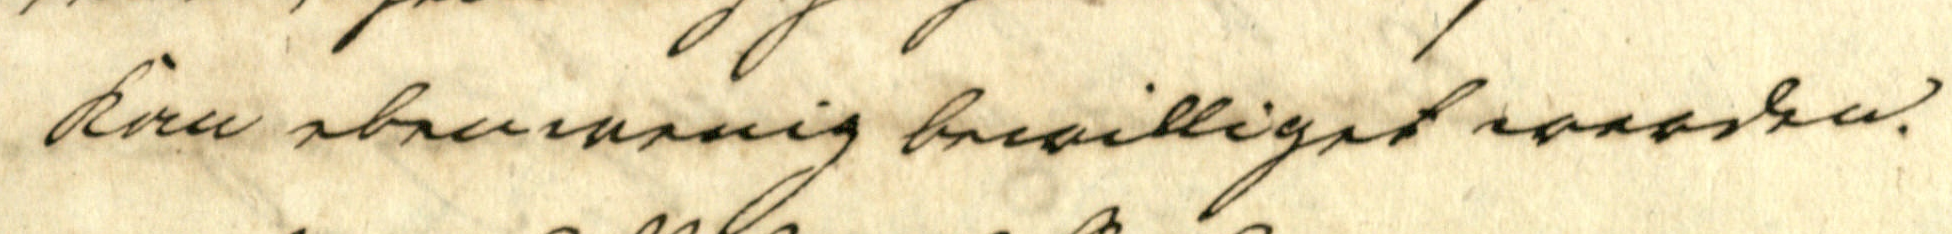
kan eben wenig bewilliget werden.
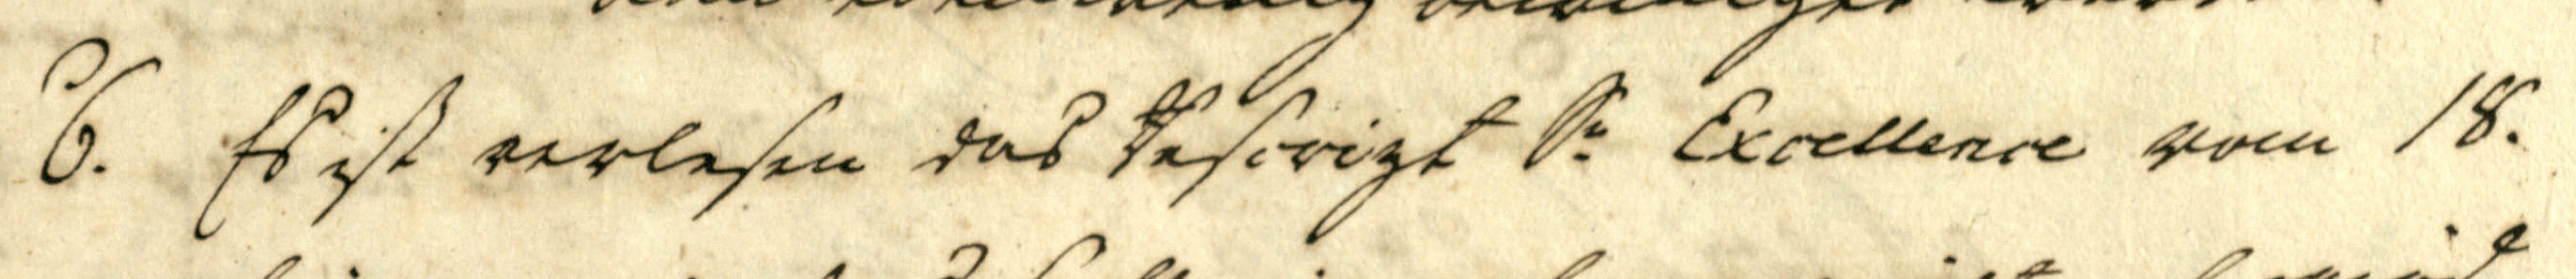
6. Es ist verlesen das Rescript Sr Excellence vom 18.
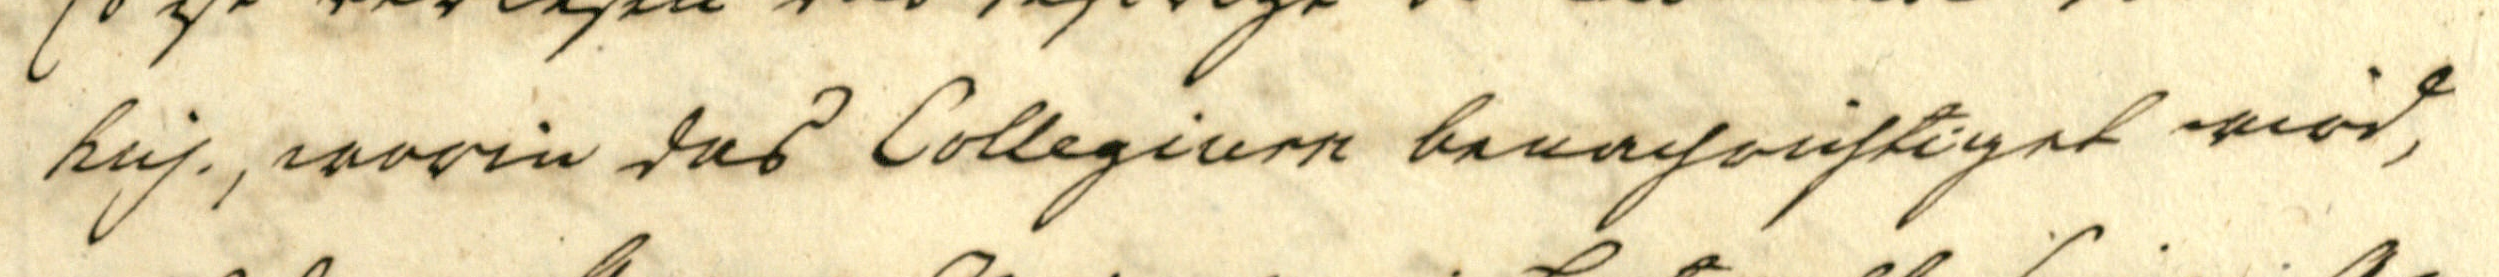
huj., worin das Collegium benachrichtiget wird,
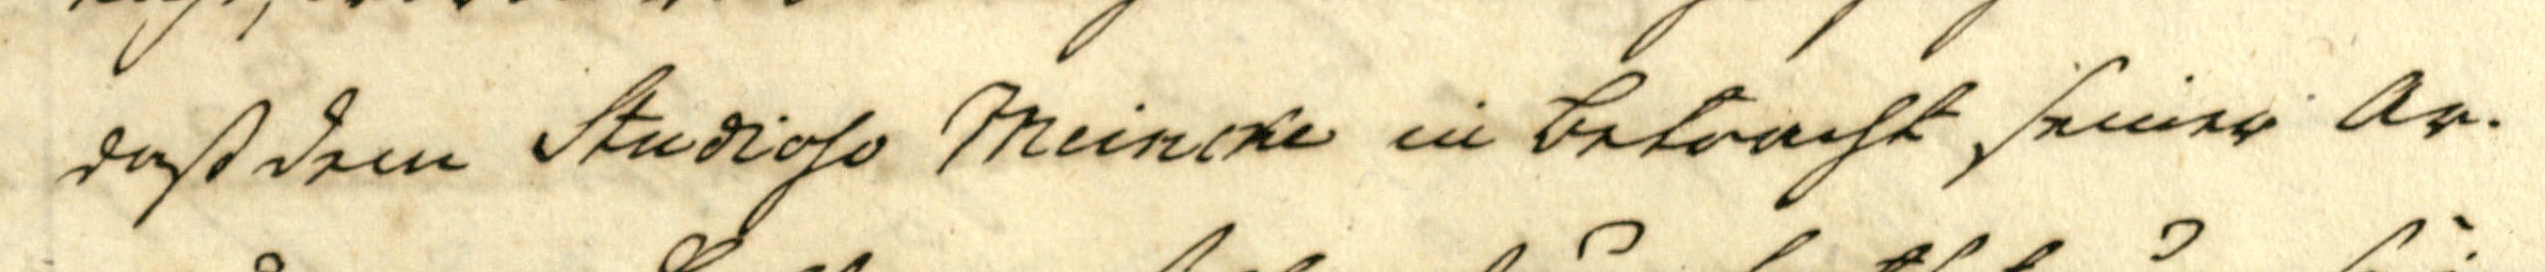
daß dem Studioso Meincke in Betracht seiner Ar¬
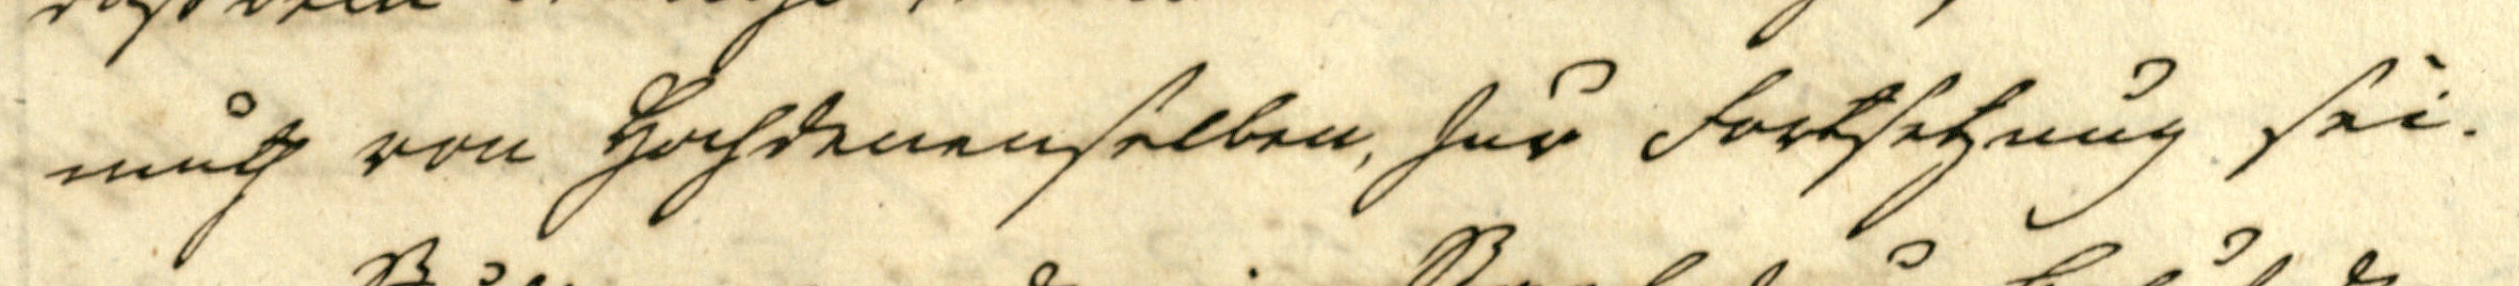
muth von Hochdenenselben, zur Fortsetzung sei¬
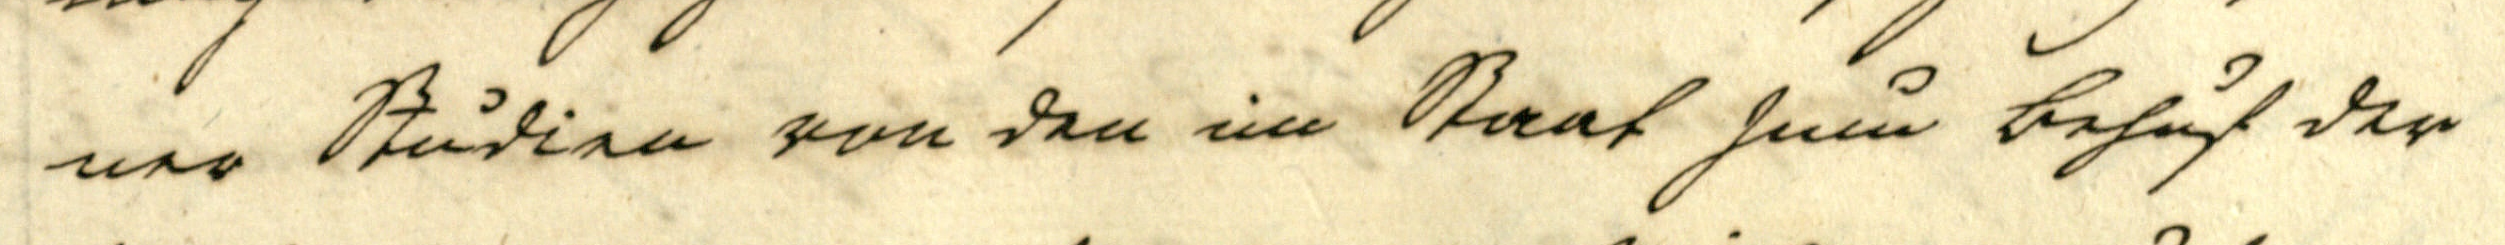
ner Studien von den im Staat zum Behuf der
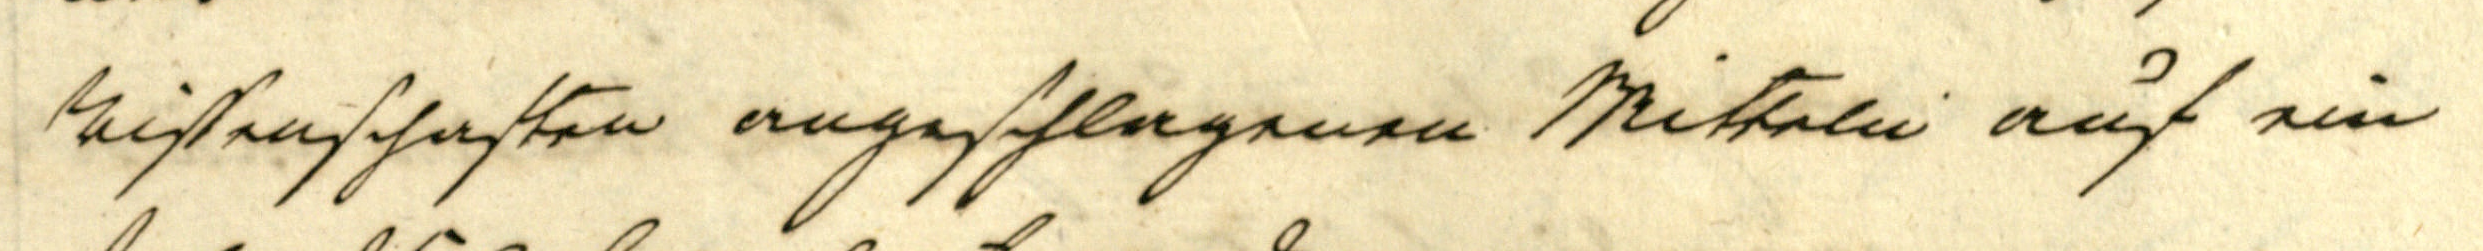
Wissenschaften angeschlagenen Mitteln auf ein
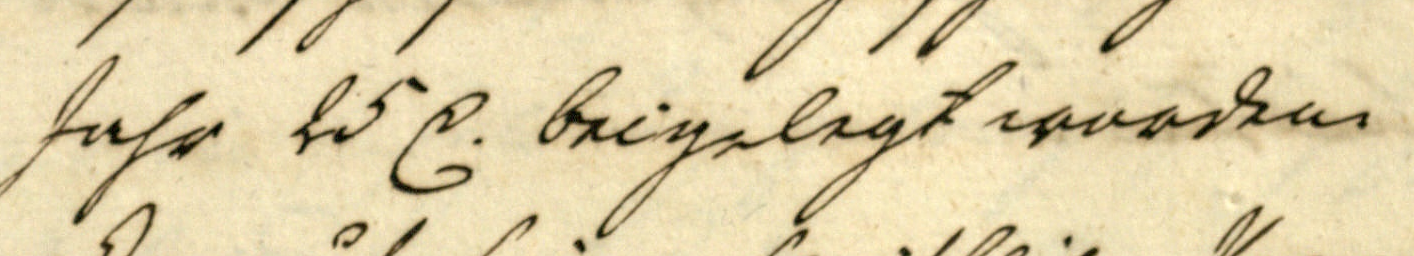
Jahr 25 l. beigelegt worden.
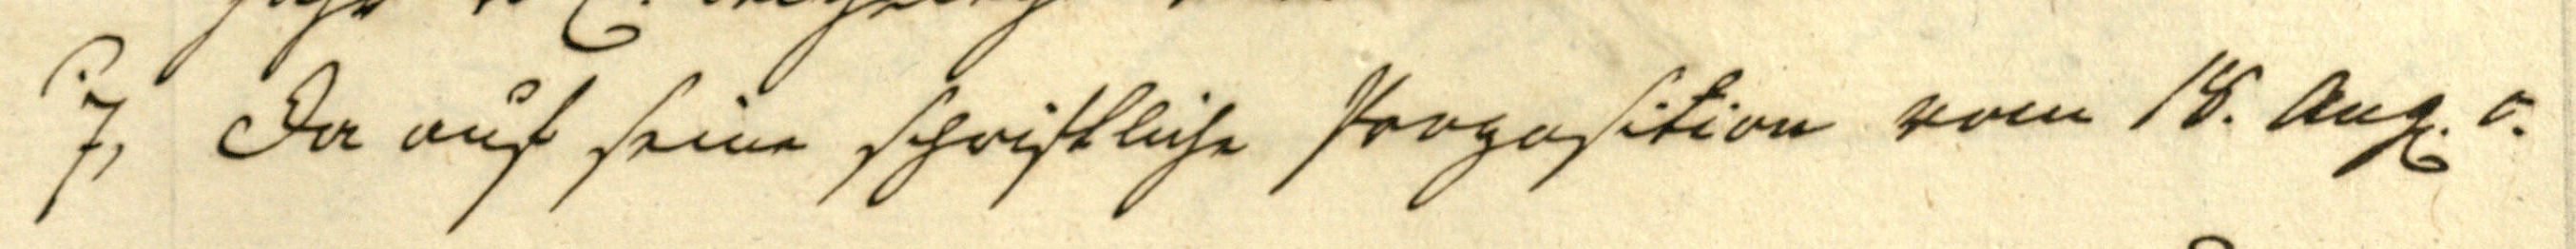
7, Da auf seine schriftliche Proposition vom 18. Aug. c.
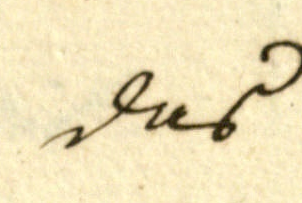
das
